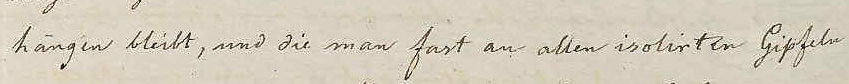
hängen bleibt, und die man fast an allen isolirten Gipfeln
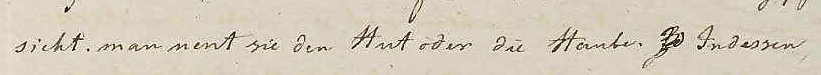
sieht. nent sie den Hut oder die Haube. J Indessen
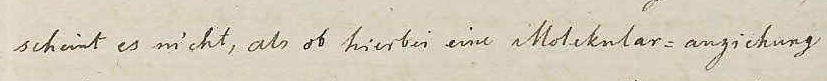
scheint es nicht, als ob hierbei eine Molekular-anziehung
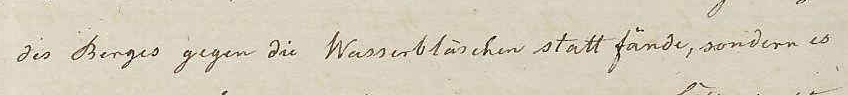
des Berges gegen die Wasserbläschen statt fände, sondern es
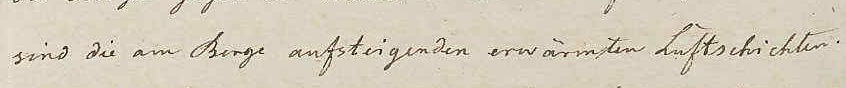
sind die am Berge aufsteigenden erwärmten Luftschichten.
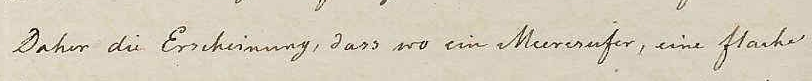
Daher die Erscheinung, dass wo ein Meeresufer, eine flache
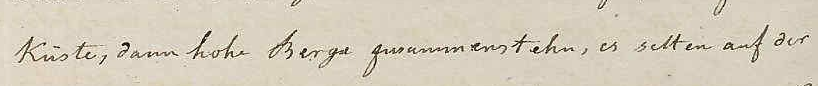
Küste, dann hohe Berge zusammenstehn, es selten auf der
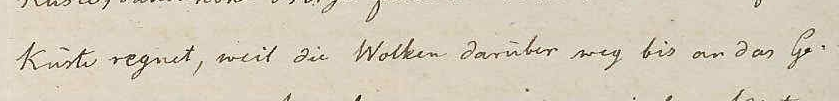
Küste regnet, weil die Wolken darüber weg bis an das Ge-
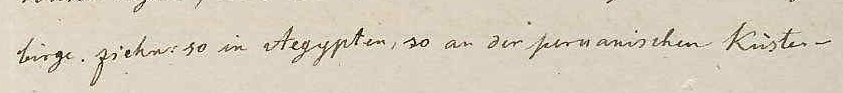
birge ziehn: so in Aegypten, so an der peruanischen Küste. –
